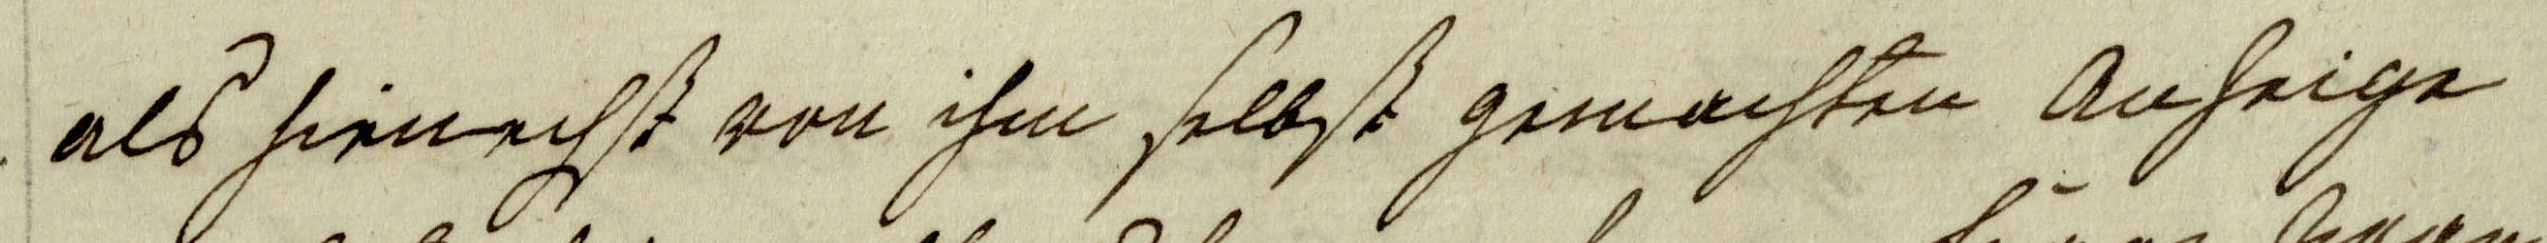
als hienechst von ihm selbst gemachten Anzeige
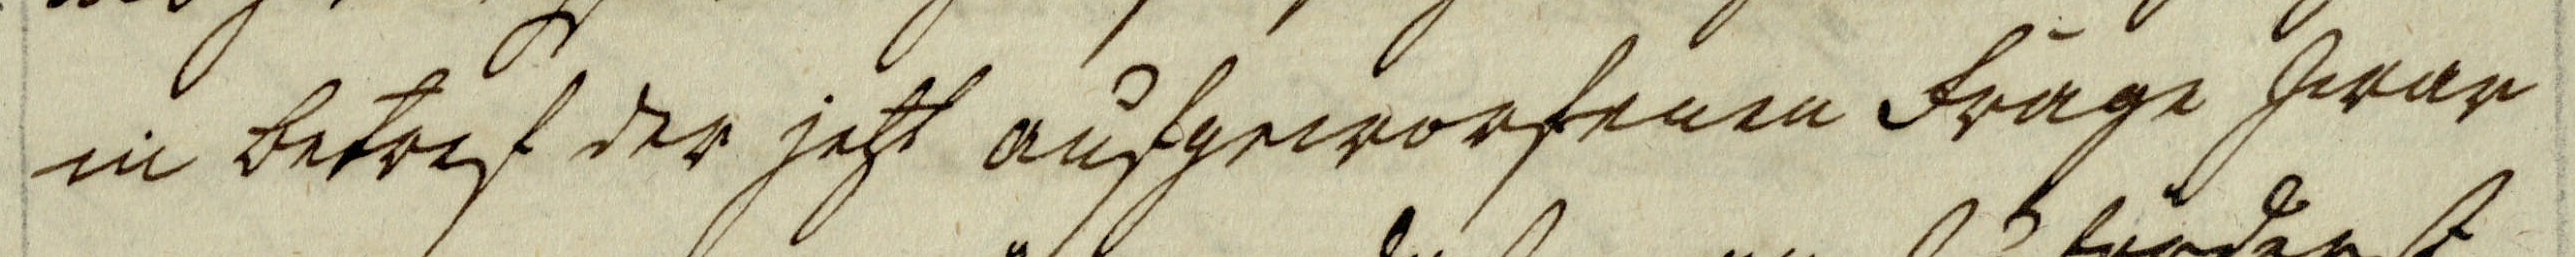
in Betref der jetzt aufgeworfenen Frage zwar
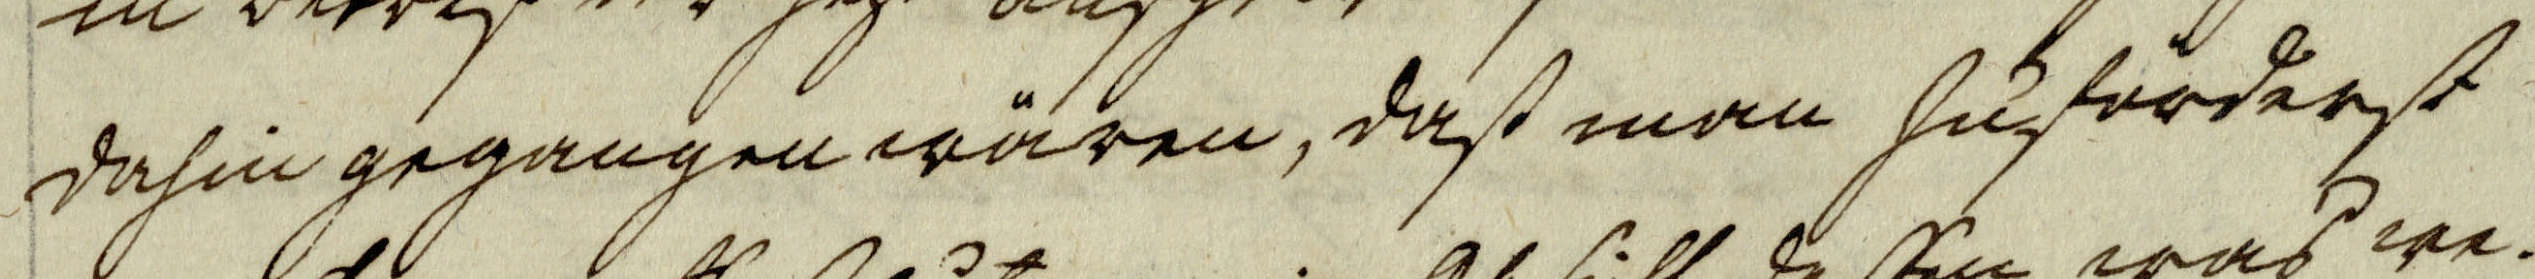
dahin gegangen wären, daß man zuförderst
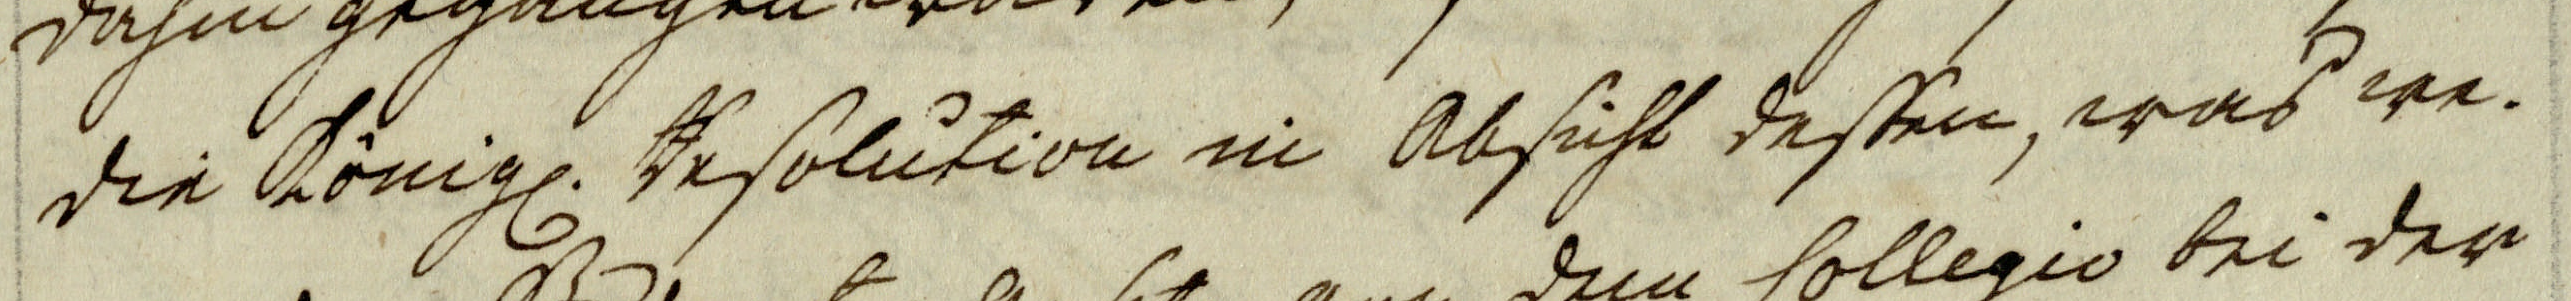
die Königl. Resolution in Absicht dessen, was we¬
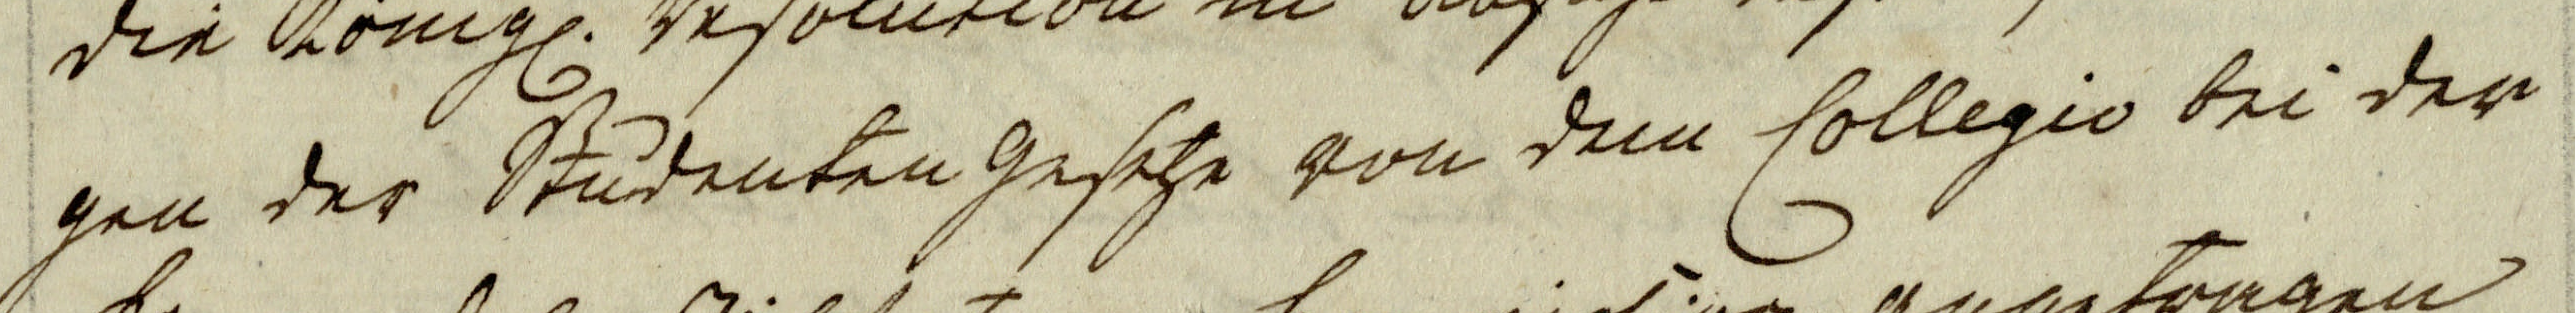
gen der Studenten Gesetze von dem Collegio bei der
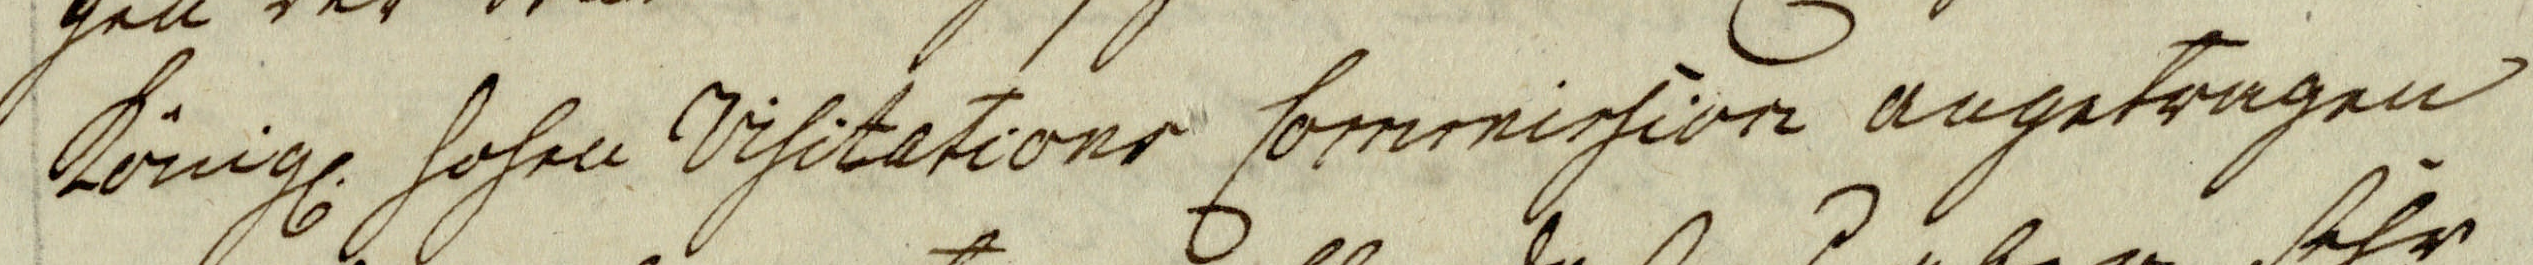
Königl. hohen Visitations Commission angetragen
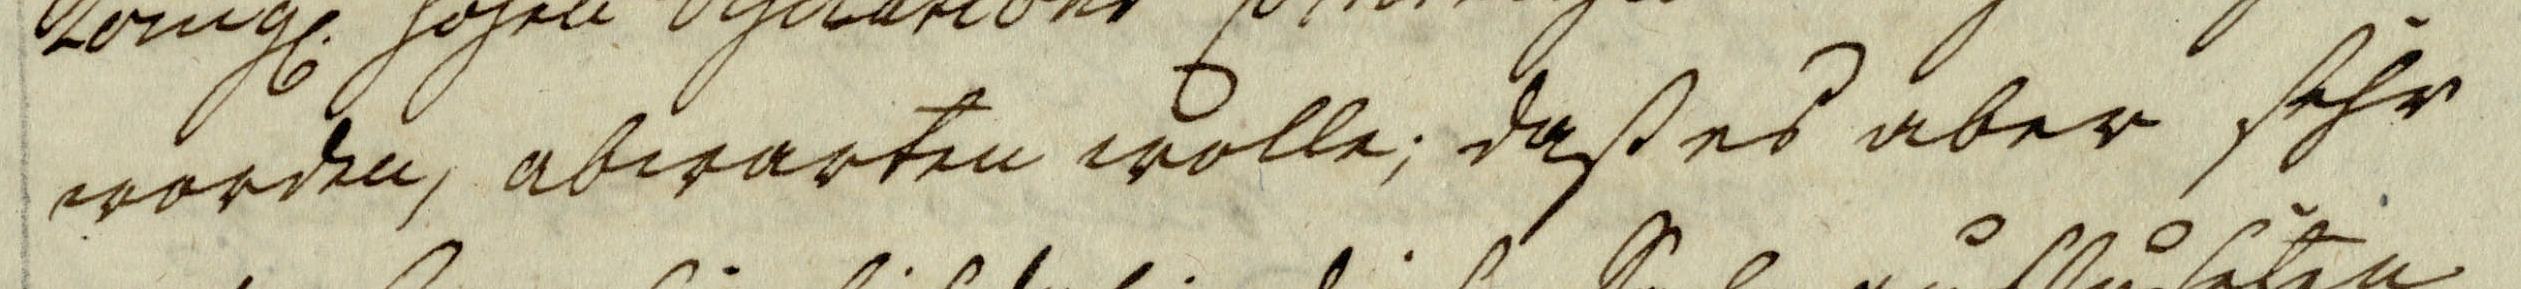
worden, abwarten wolle; daß es aber sehr
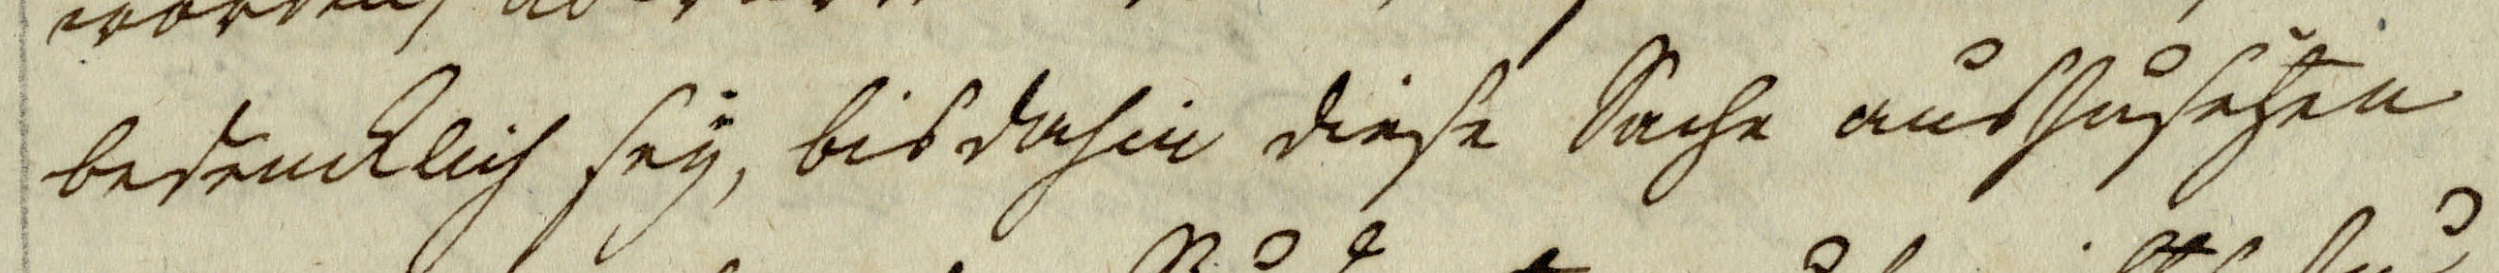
dedencklich seÿ, bis dahin diese Sache auszusetzen
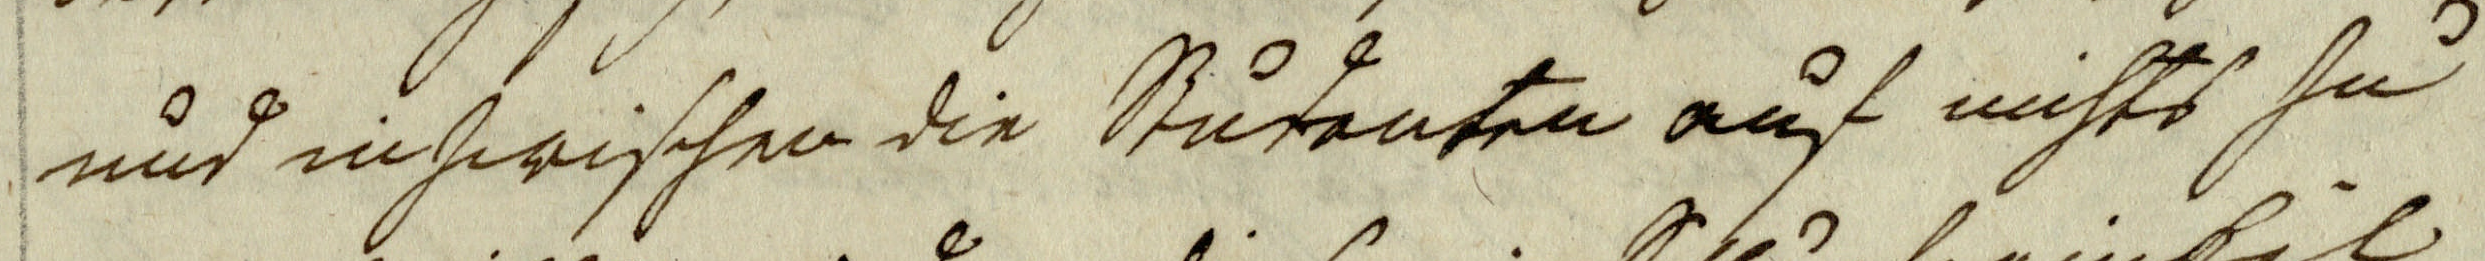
und inzwischen die Studenten auf nichts zu
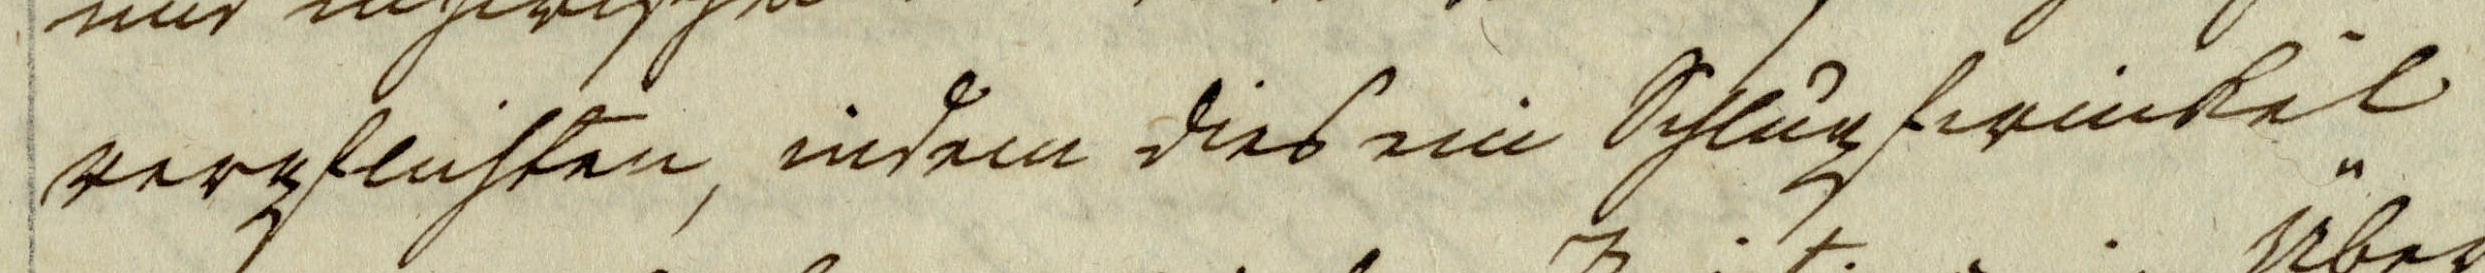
verpflichten, indem dies ein Schlupfwinkel
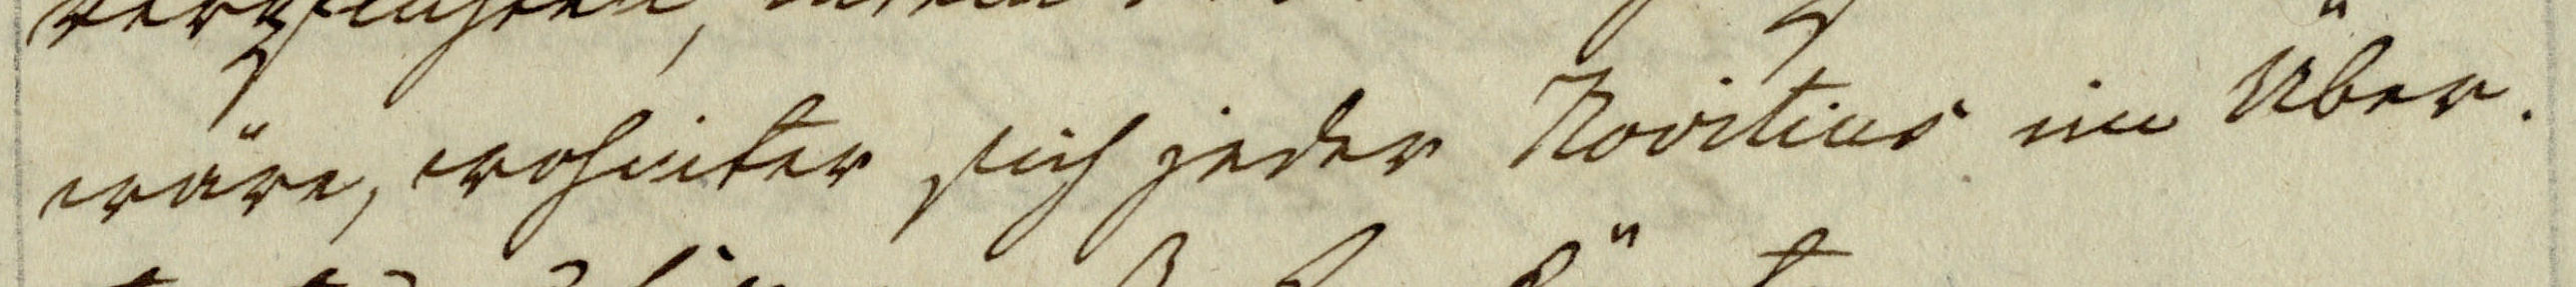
wäre, wohinter sich jeder Novitius im Über¬
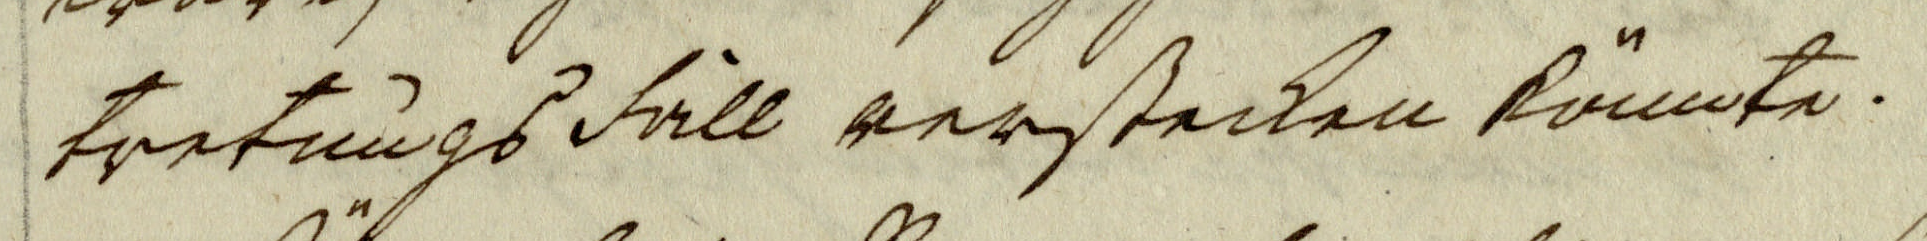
tretungs Fall verstecken könnte.
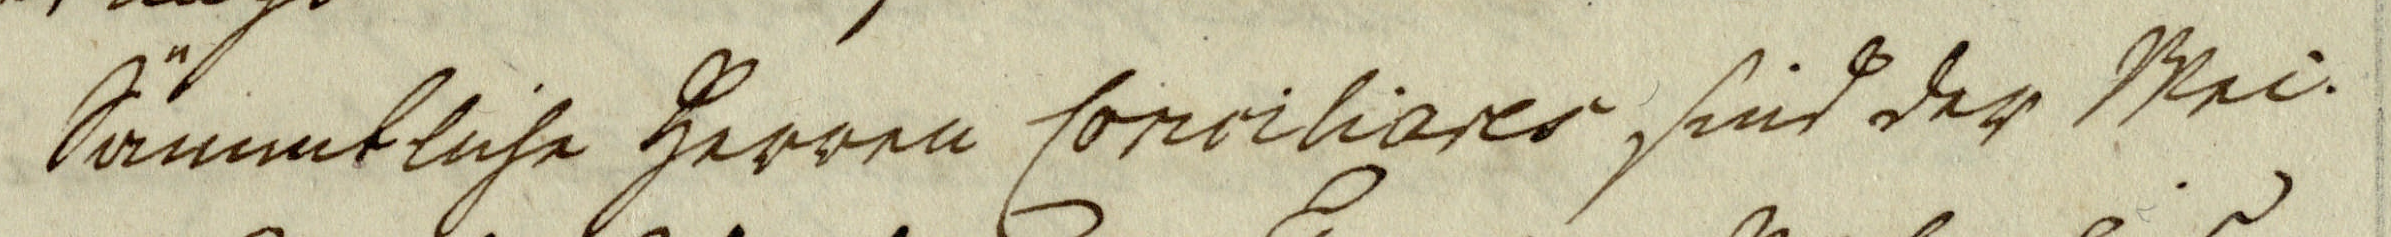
Sämmtliche Herren Conciliares sind der Mei¬
